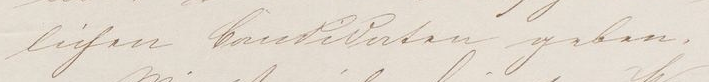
lichen Candidaten geben.
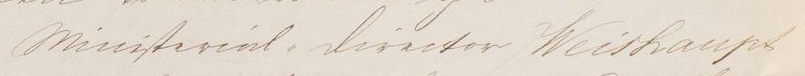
Ministerial-Director Weishaupt
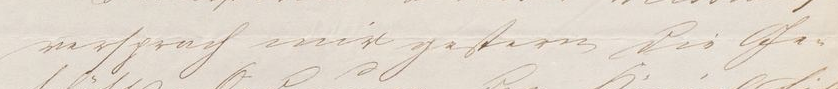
versprach mir gestern die Ge-
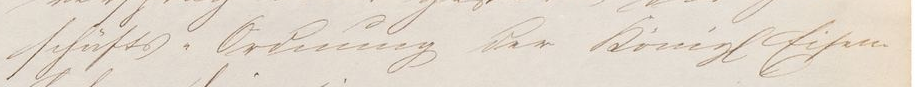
schäfts-Ordnung der königl Eisen-
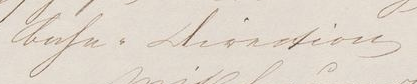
bahn-Direction.
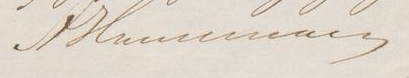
A Hansemann
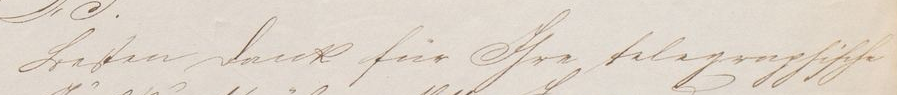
Besten Dank für Ihre telegraphische
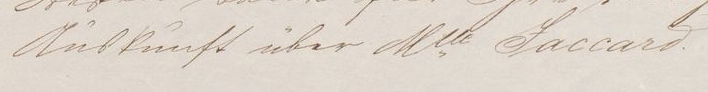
Auskunft über Mlle Jaccard.
